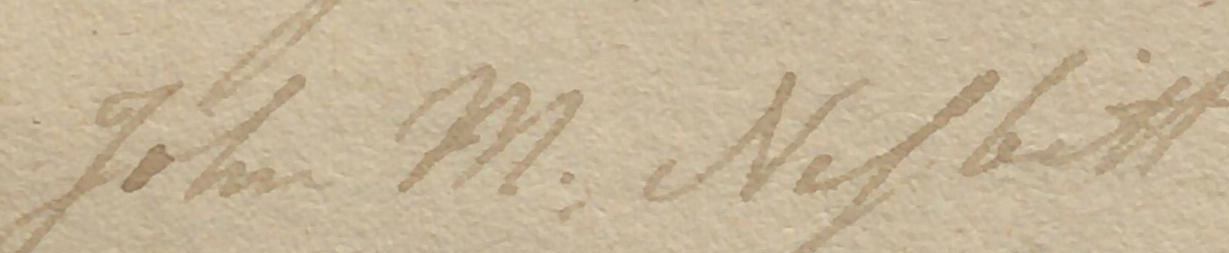toh M. Nesbitt
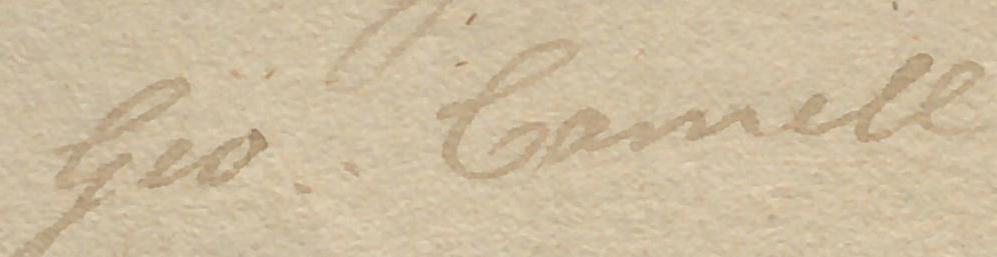Geo: Camell
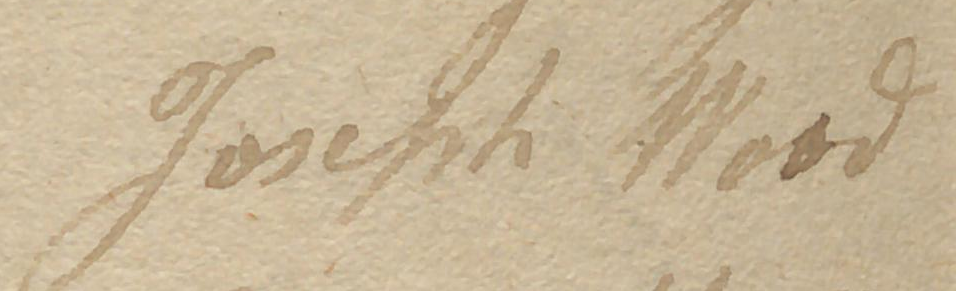Joseph Wood
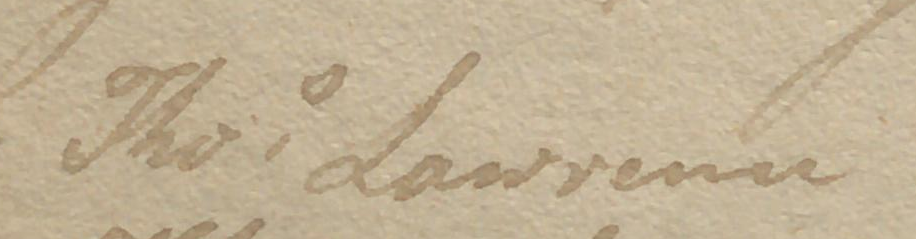Tho^s. Lawrence
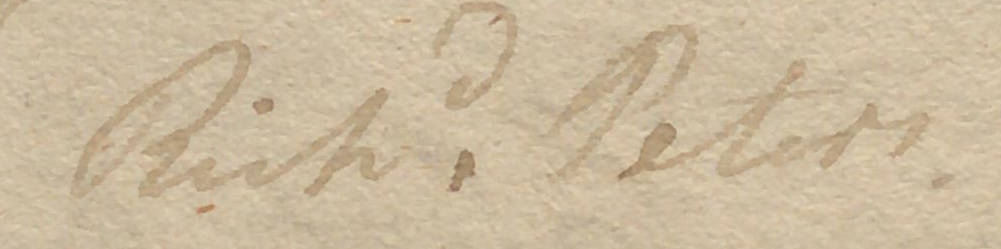Rich^d. Peters
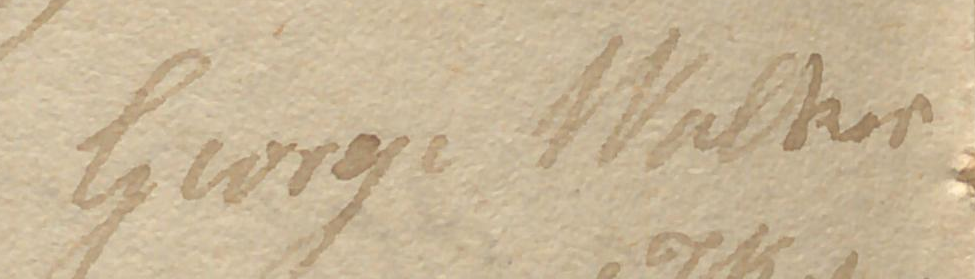George Walker
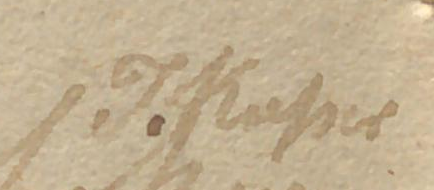T Keeper
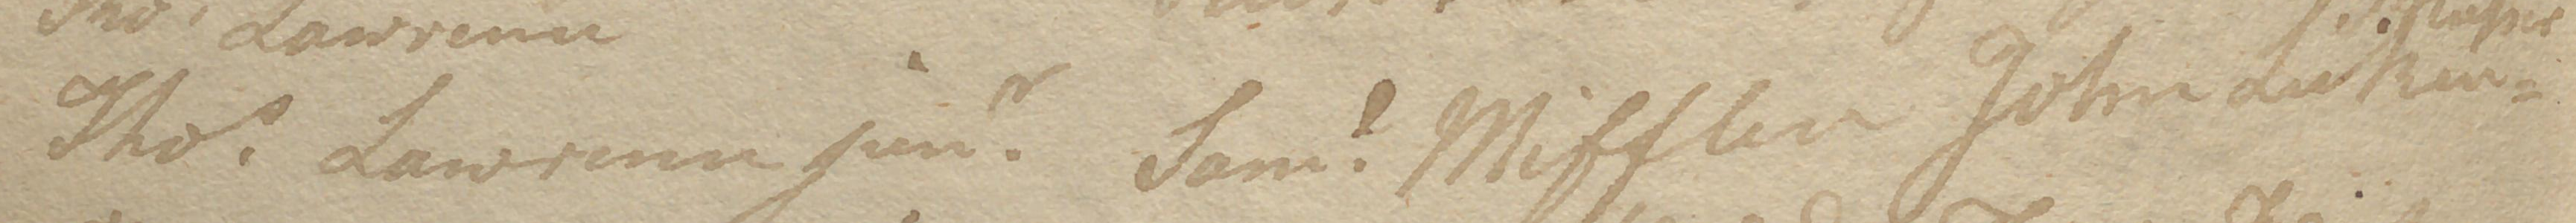Tho^s. Lawrence Jun^r. Sam^l. Mifflin John Luken-
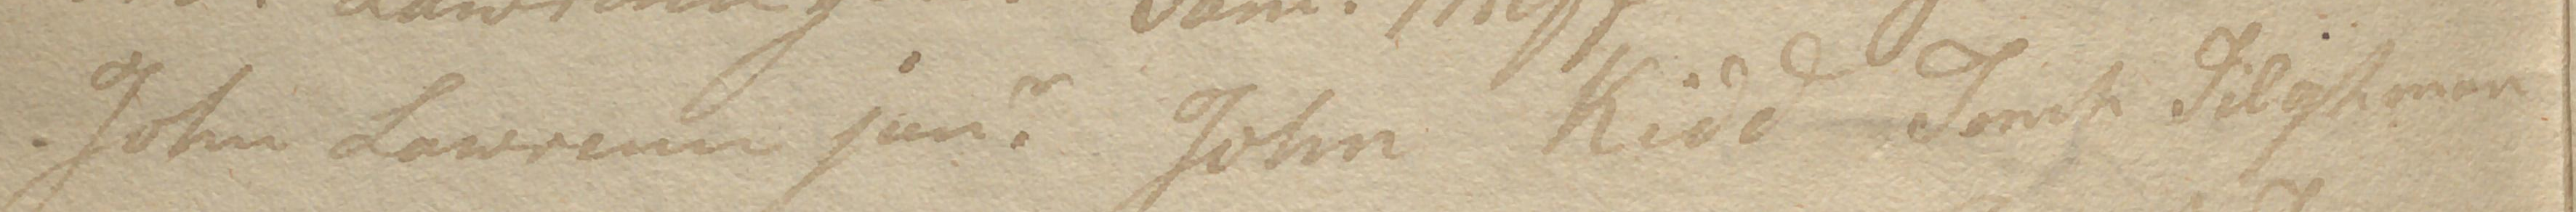John Lawrence jun^r. John Kidd Tench Tilghman
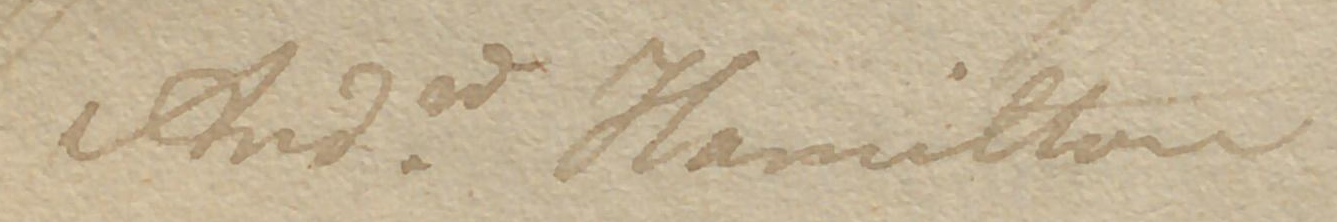And^w. Hamilton
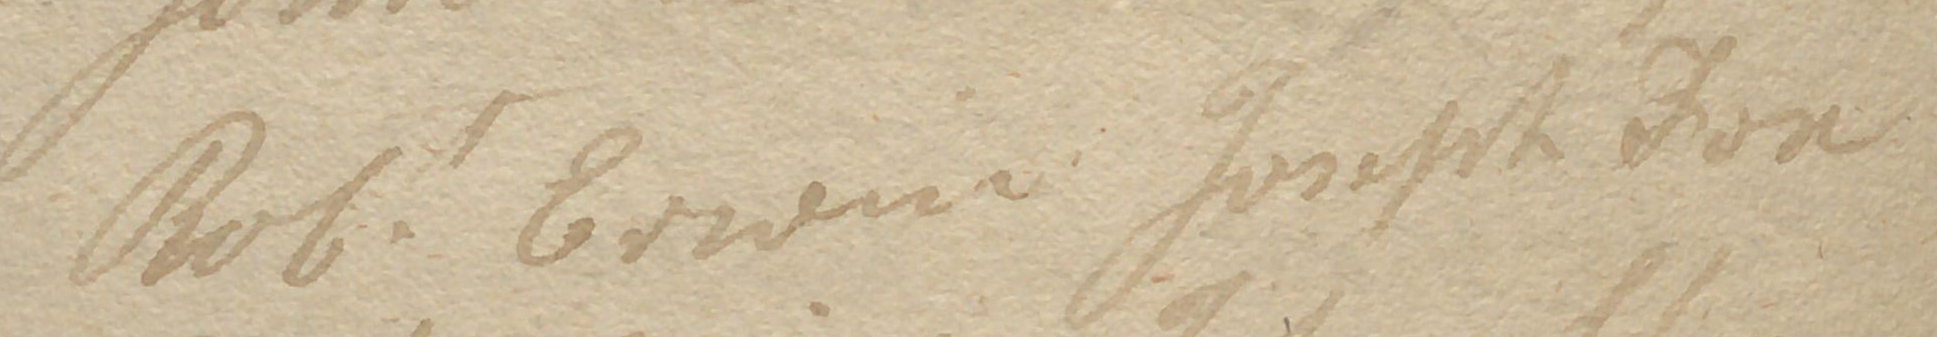Rob.^t Erwin Joseph Fox
